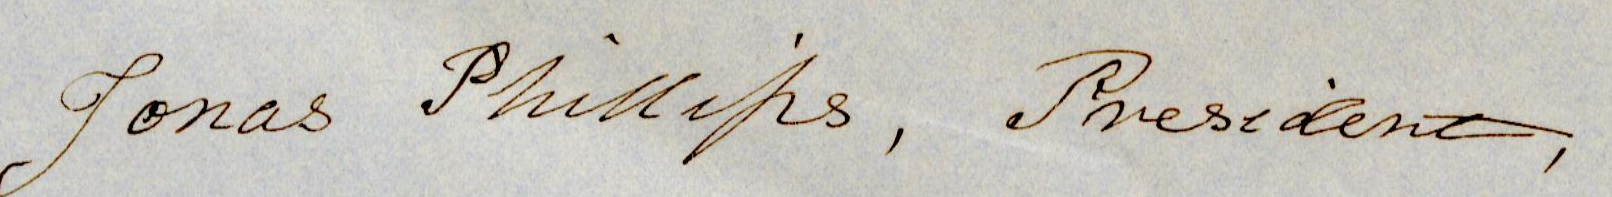Jonas Philips, President,
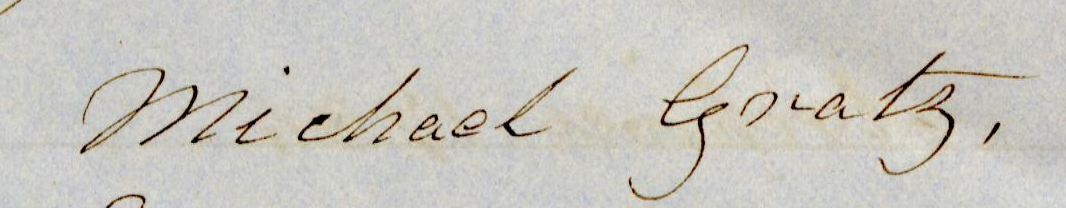Michael Gratz,
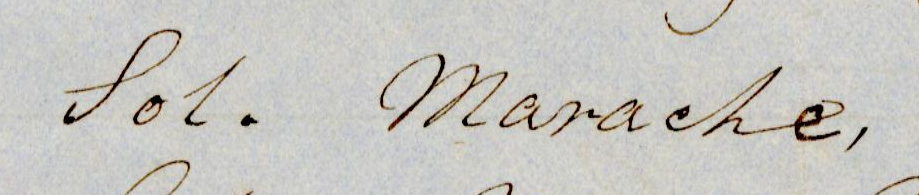Sol. Marache,
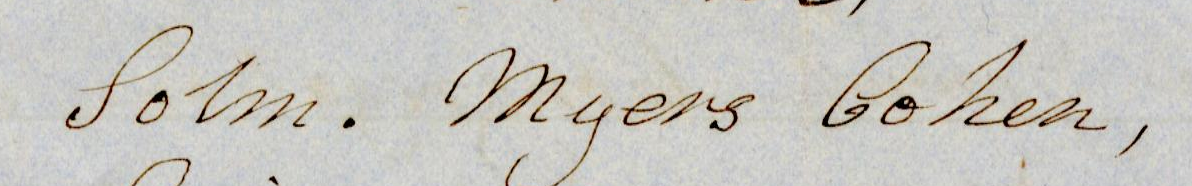Solm, Myers Cohen,
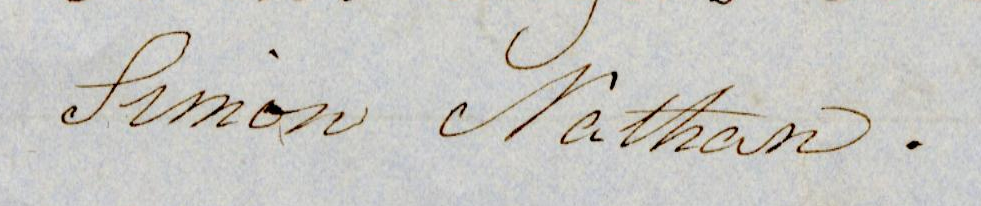Simon Nathan.
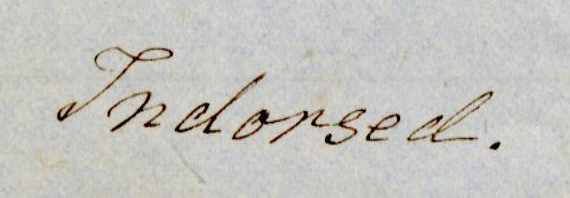Indorsed.
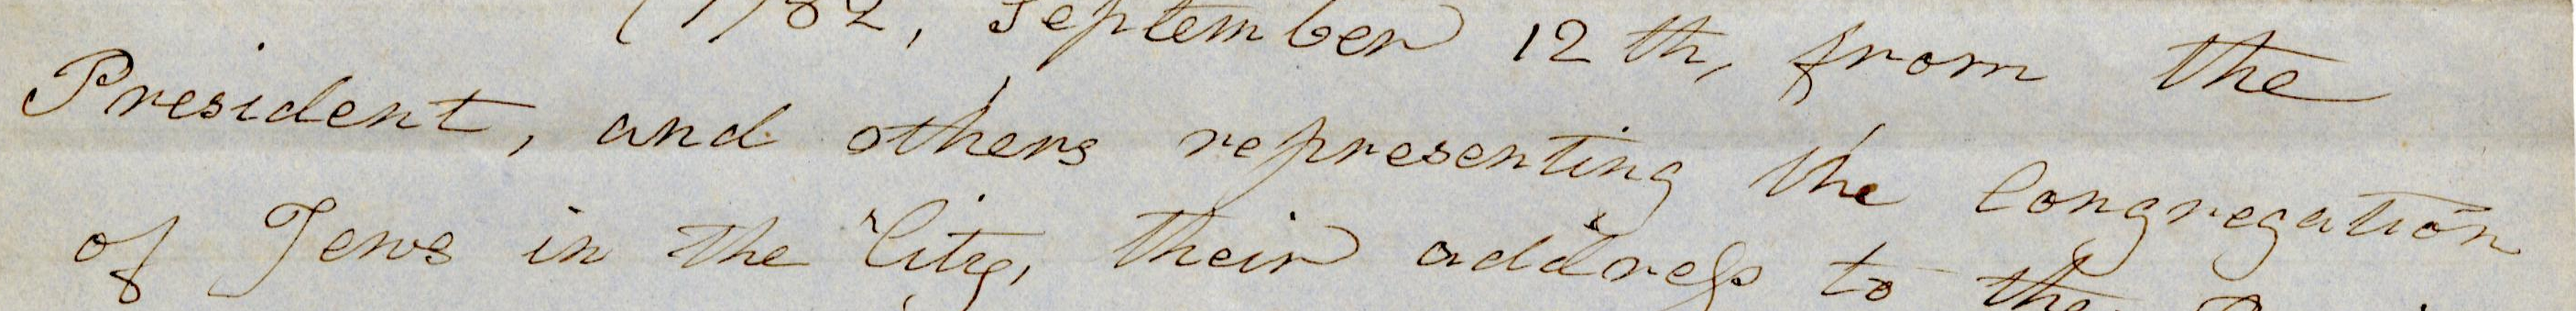President, and others representing the congregation
